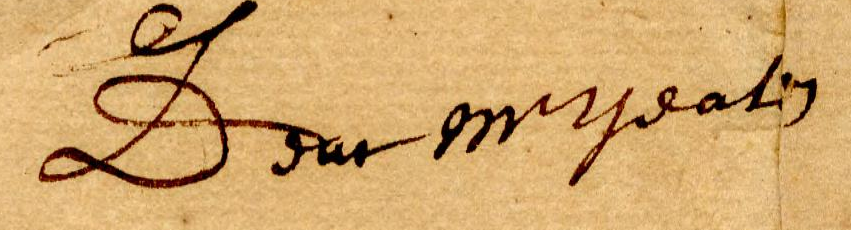Dear M^r Yeats
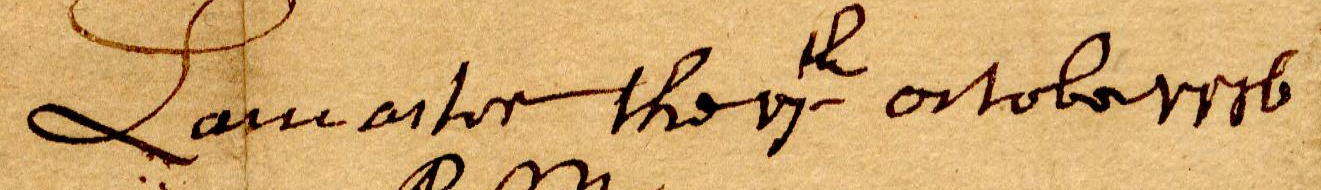Lancaster the 7^th october 1776
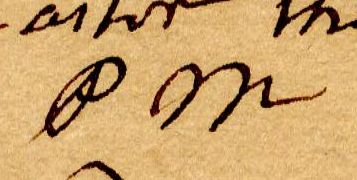PM
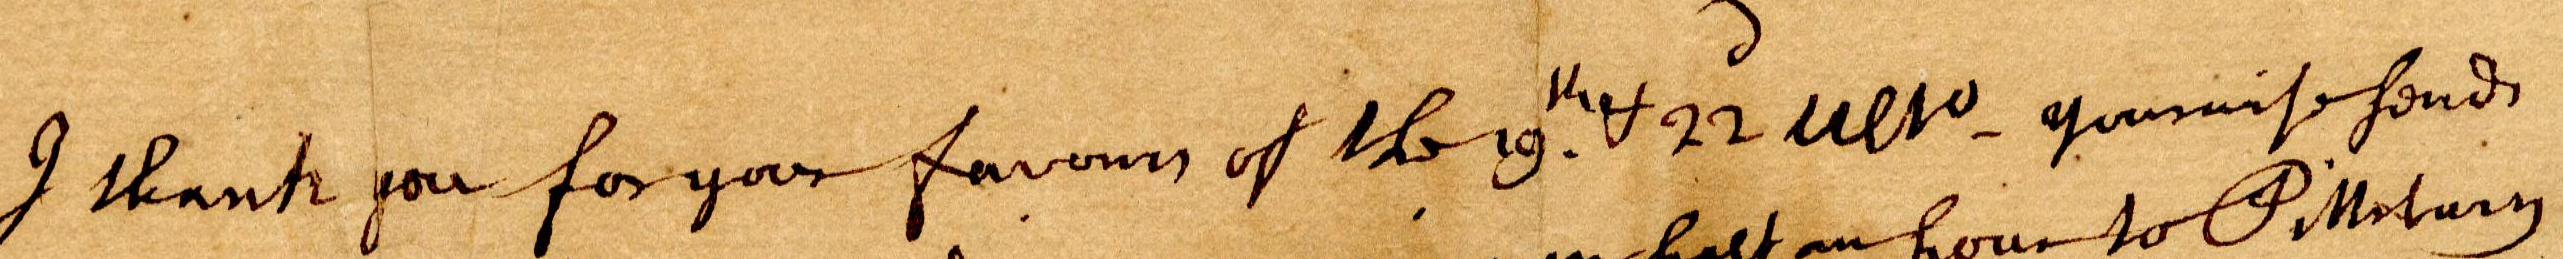I thank you for your favours of the 9^th. & 22 Ult^o- Your wife sends
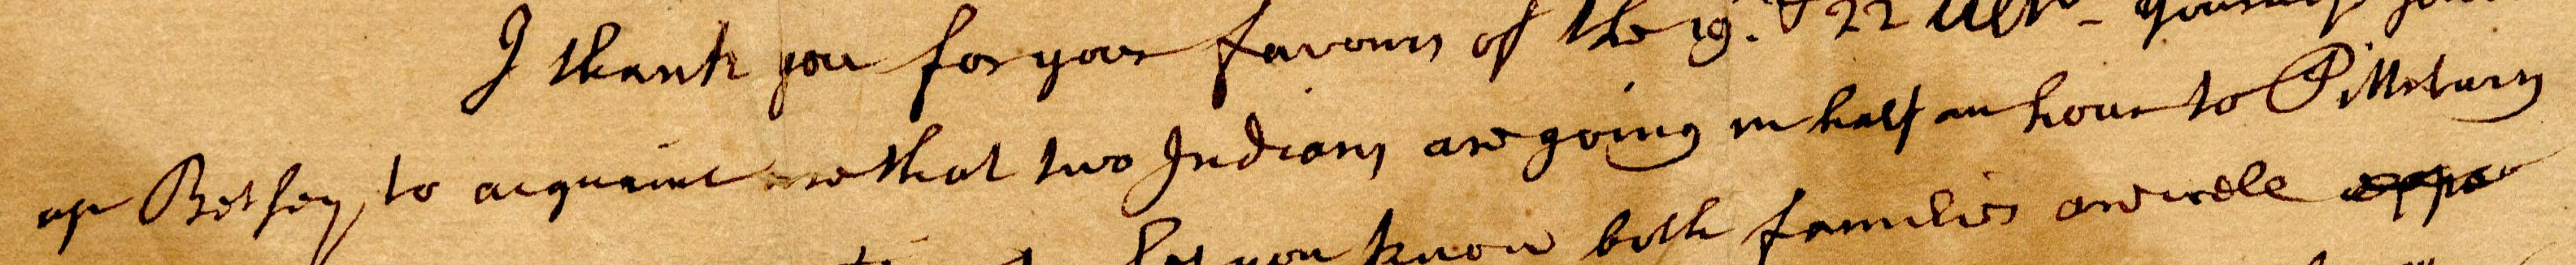up Betsey, to acquaint us that two Indians are going in half an hour to Pittsburg
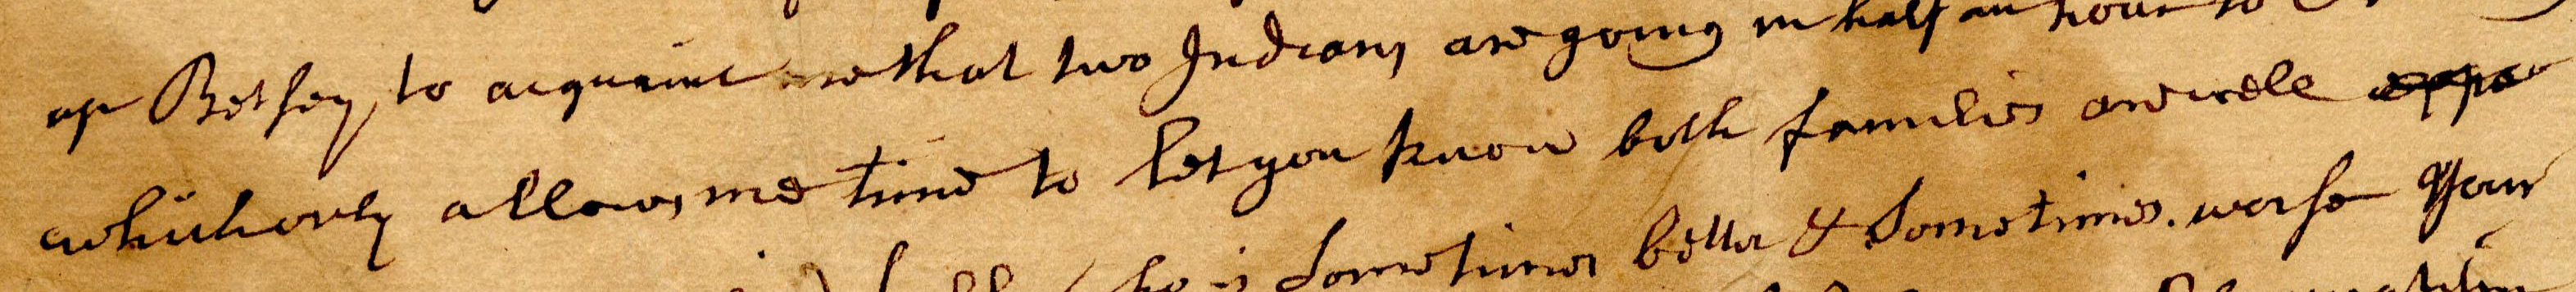whichonly allows me time to let you know both familes are well [_____]
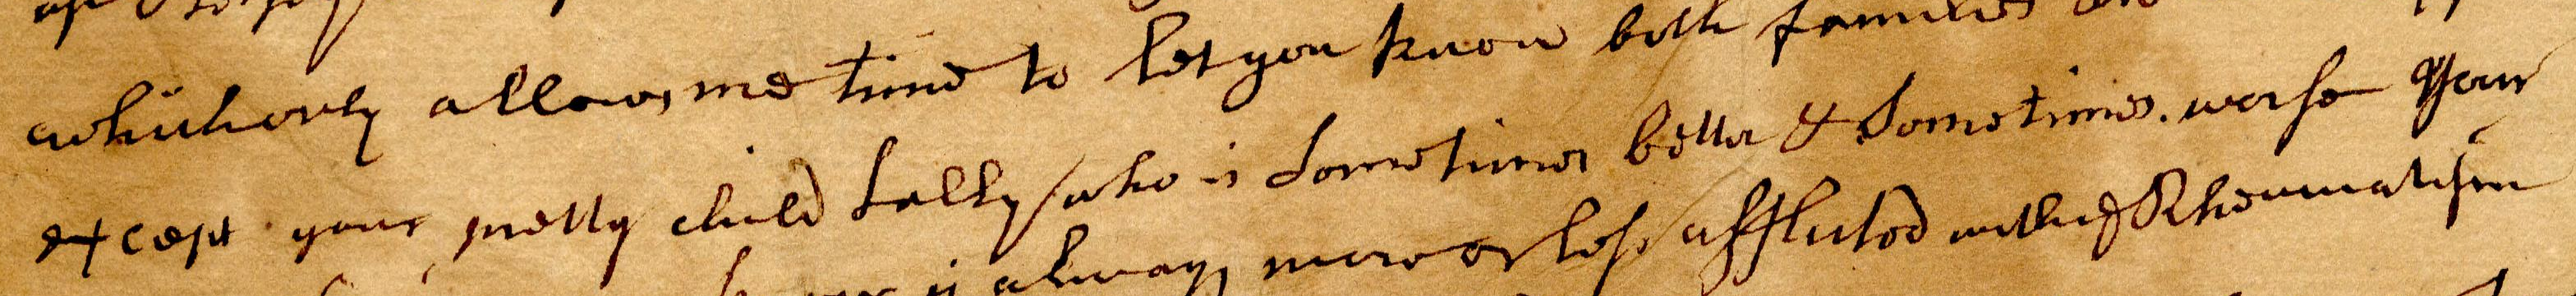except your smelly child Sally who is sometimes better & Sometimes worse- your
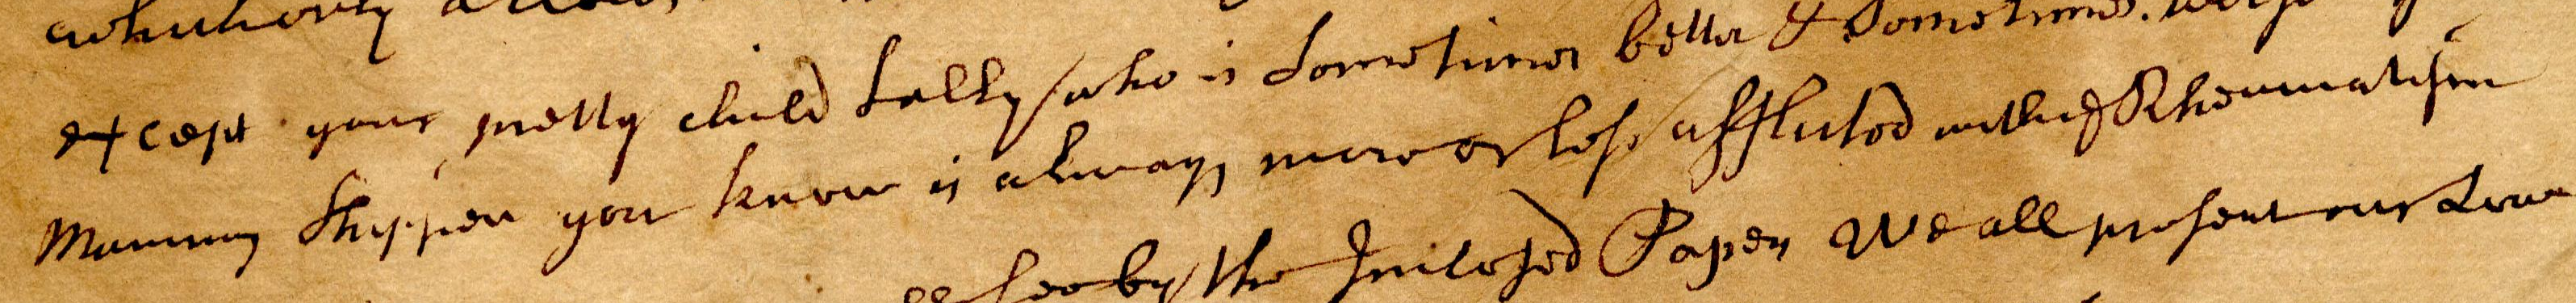Mummy Shippen you know is always more or less afflicted with y Rhoumatism
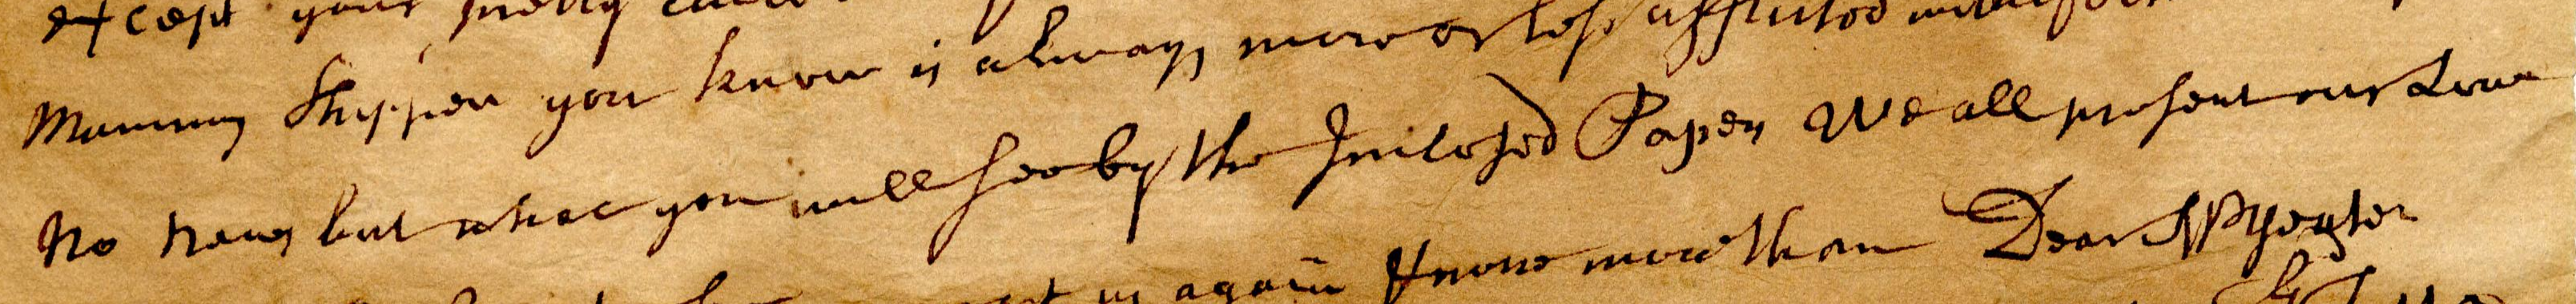no news but what you will for by the Inclosed Papers We all present our Love
